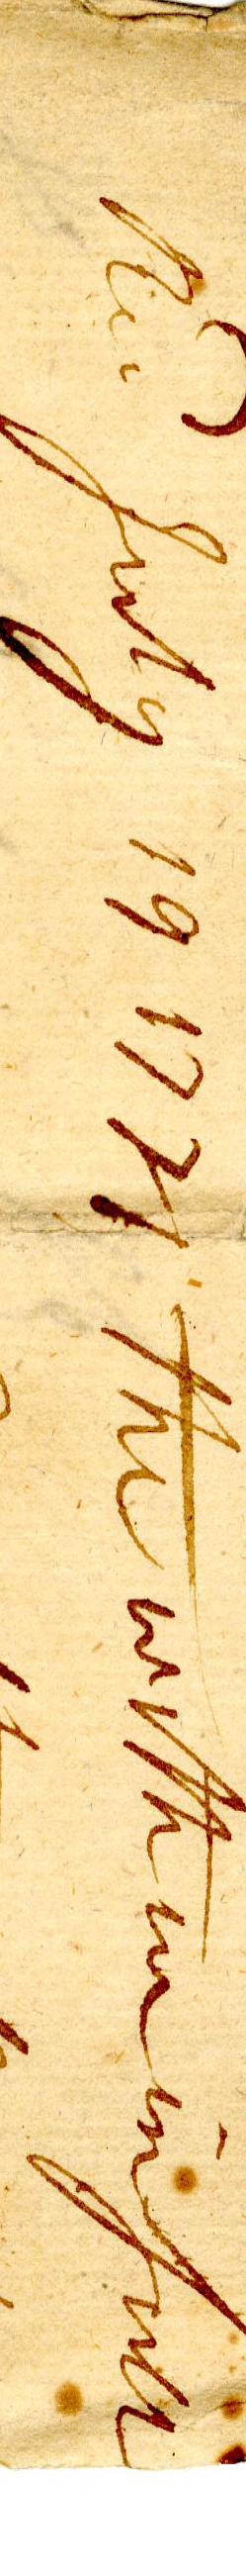Rec^d July 19 1771 the within in full
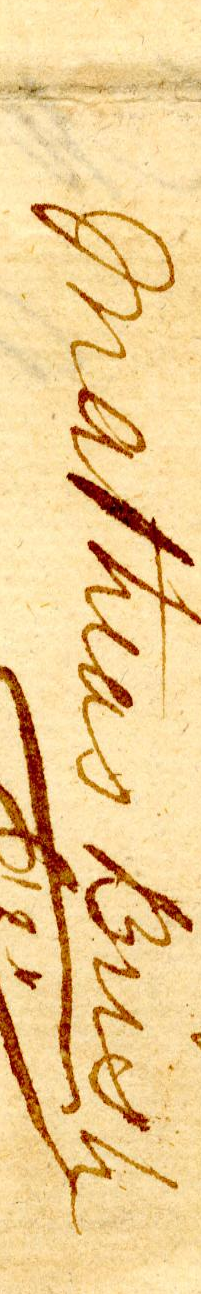Mathias Bush
